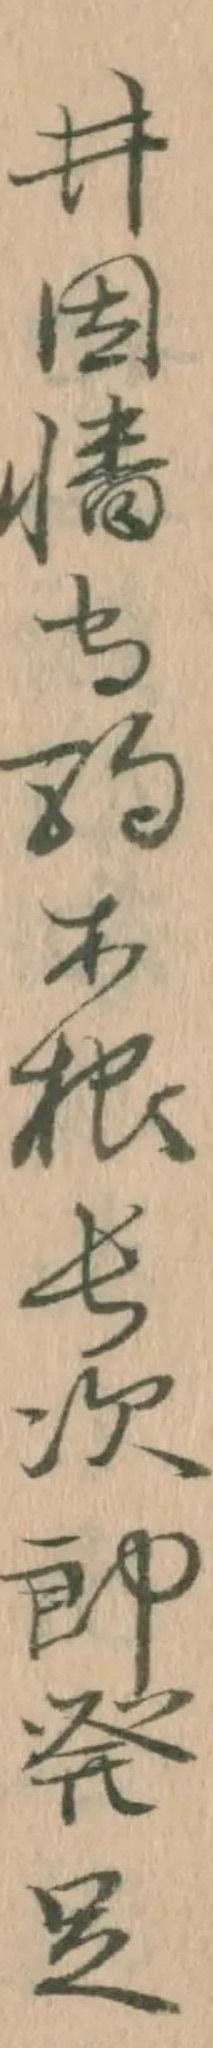井因幡守駒木根長次郎発足
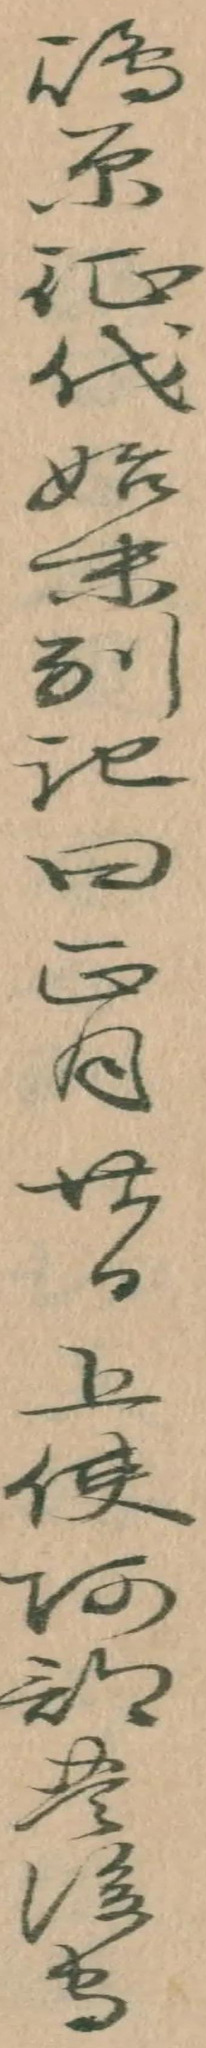島原征伐始末別記曰正月廿日上使阿部豊後守
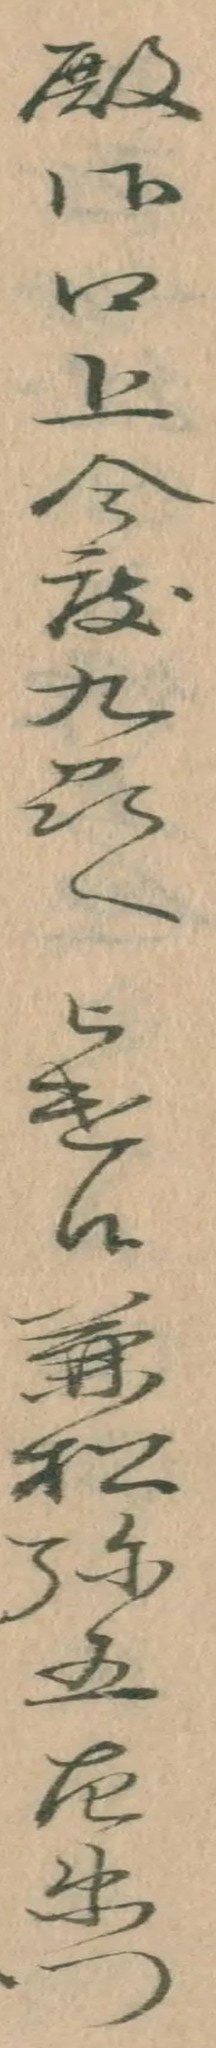殿御口上今度九州へ被遣候兼松弥五左衛門
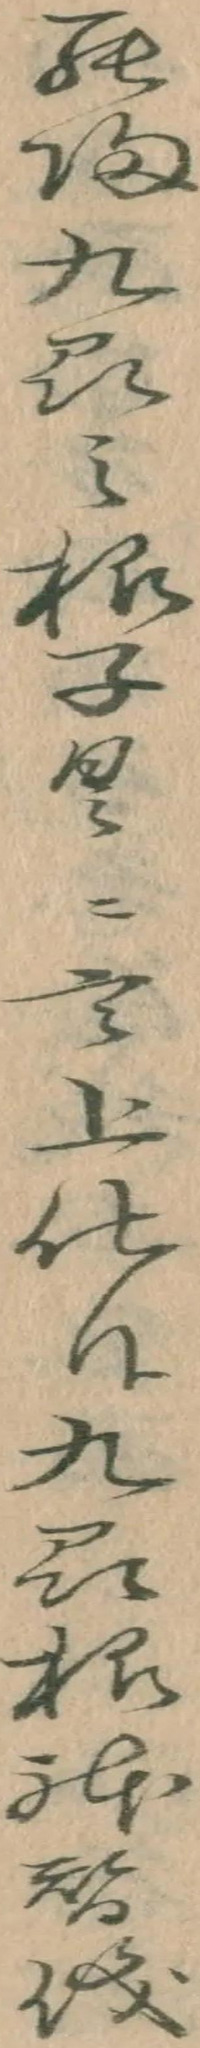罷帰九州之様子具に言上仕候九州様躰替儀
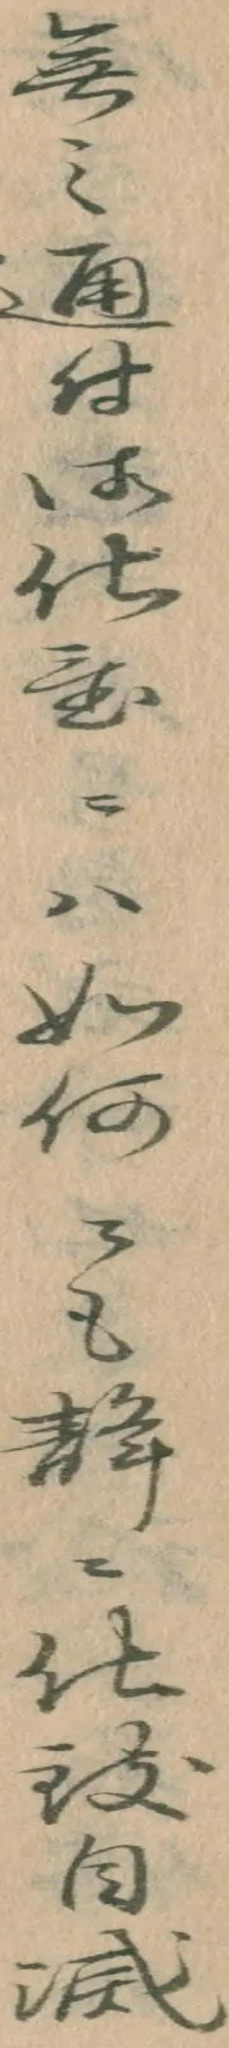無之通付御仕置には如何にも静に仕致自滅
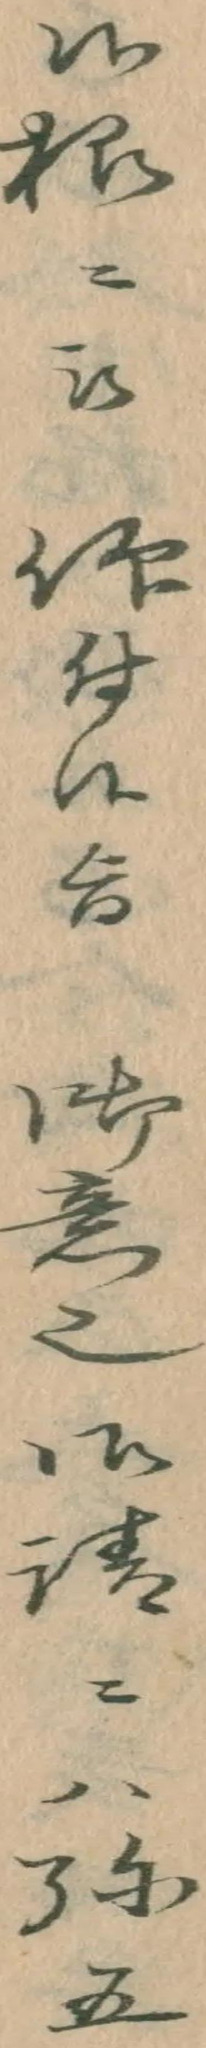候様に被仰付候旨御意也御請には弥五
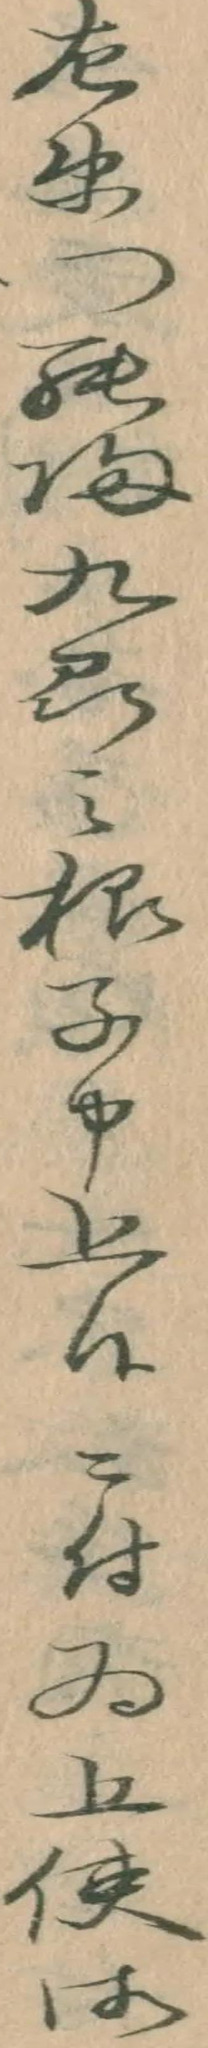左衛門罷帰九州之様子申上候に付ゐ上使御
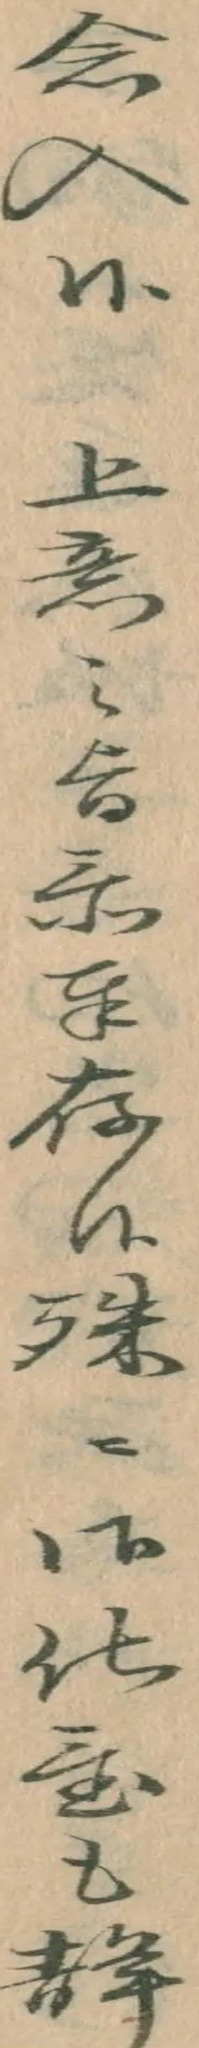念入候上意之旨忝奉存候殊に御仕置も静
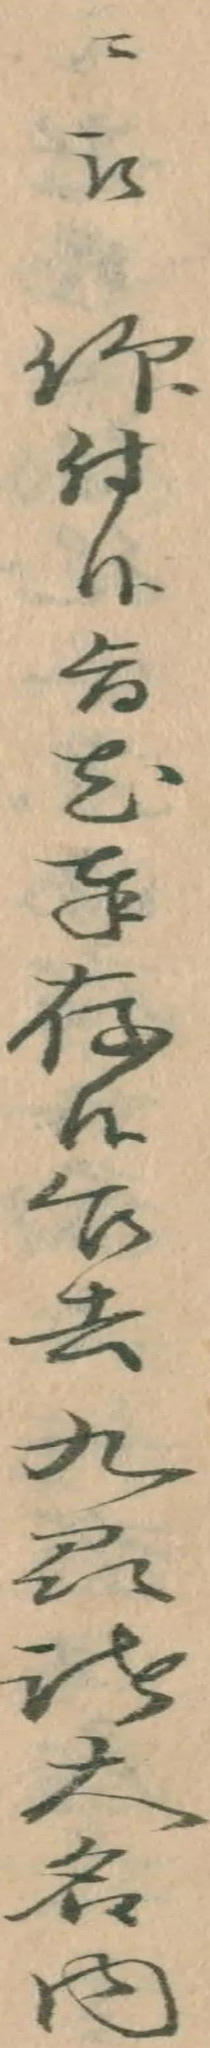に被仰付候旨尤奉存候乍去九州諸大名内

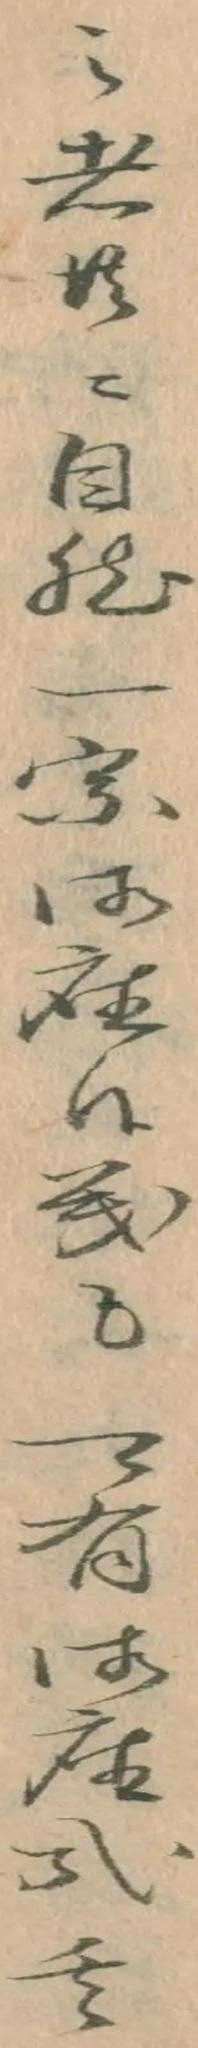之者共に自然一宗御座候義も可有御座哉其
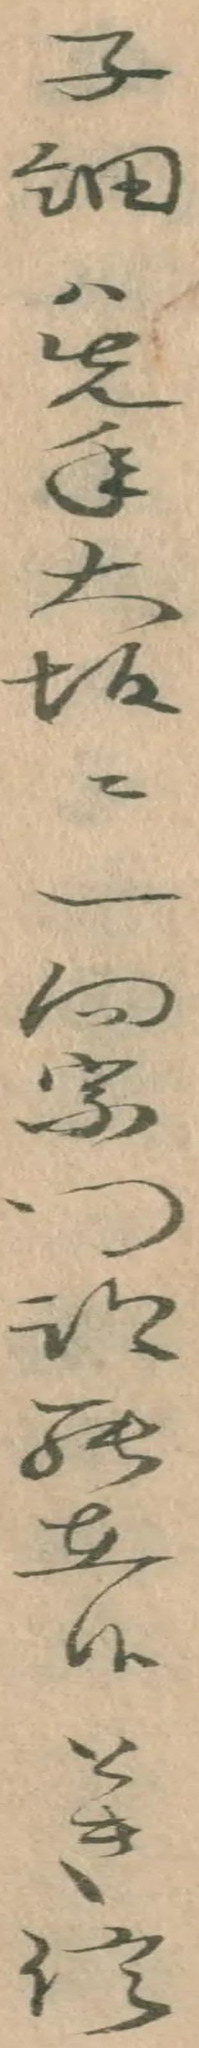子細は先手大坂に一向宗門跡罷在候とき信
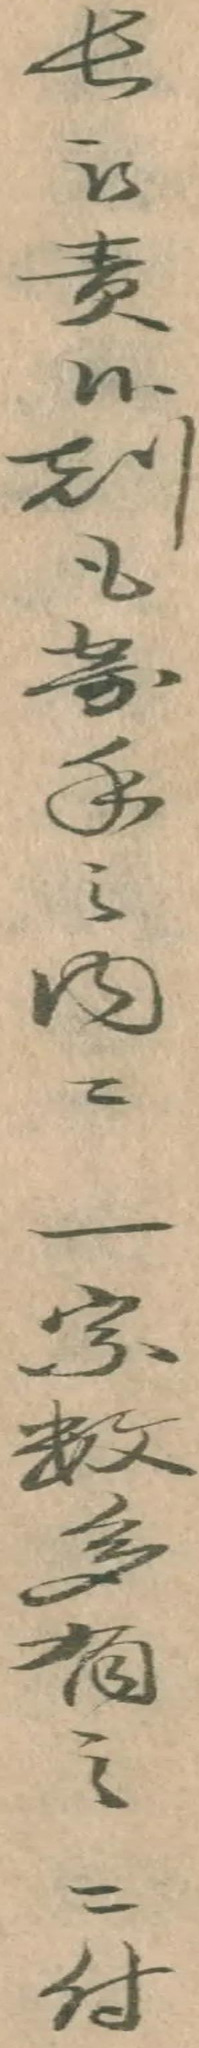長被責候刻も寄手之内に一宗数多有之に付
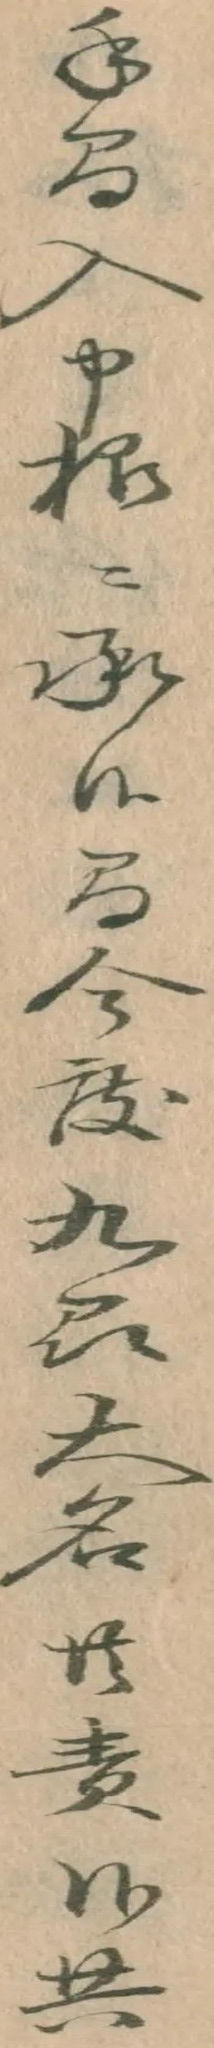手間入申様に承候間今度九州大名共責候共
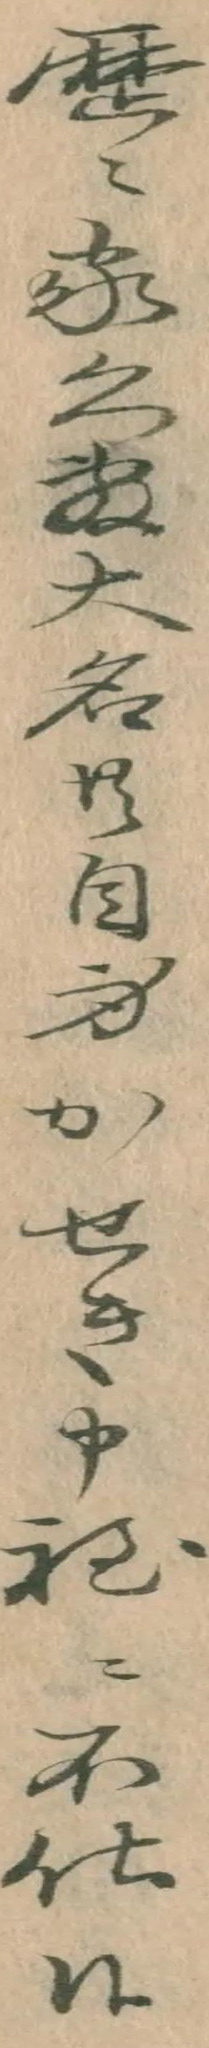歴々家久敷大名共自身かせき申程に不仕候
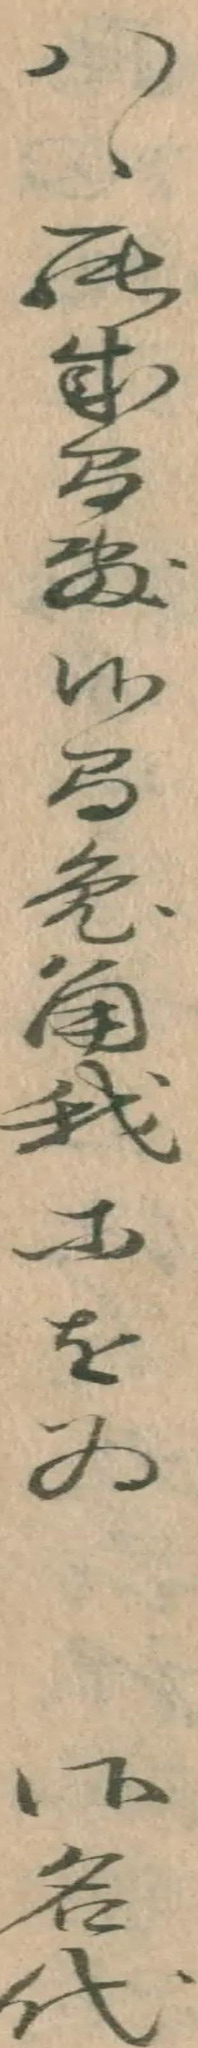はゝ罷成間敷候間兎角我等をゐ御名代
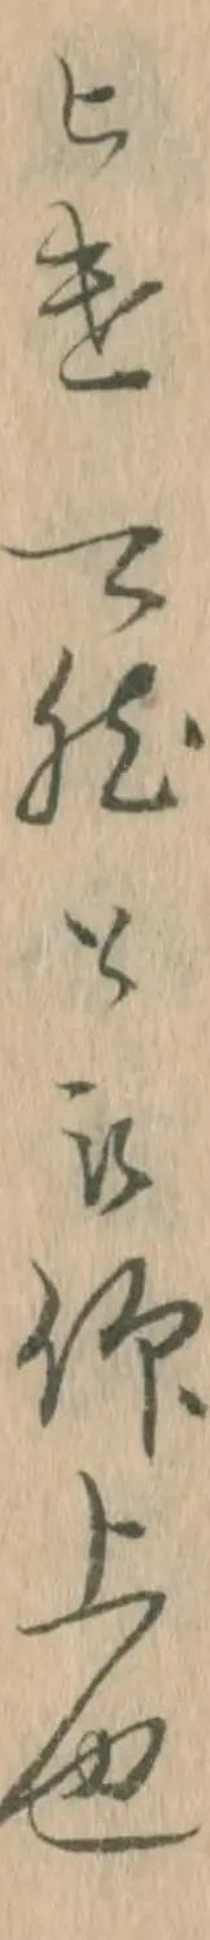被遣可然と被仰上也
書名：切支丹御退治記 49巻. [6]
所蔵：国立国会図書館 National Diet Library, JAPAN
